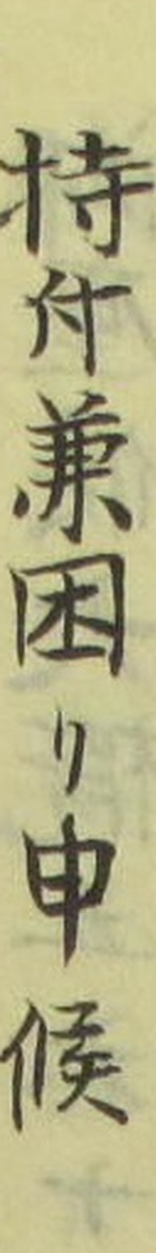持付兼困リ申候
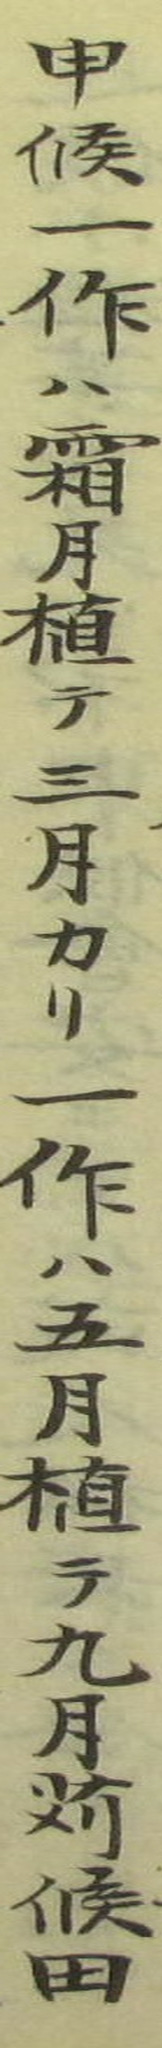申候一作ハ霜月植テ三月カリ一作ハ五月植テ九月苅候田
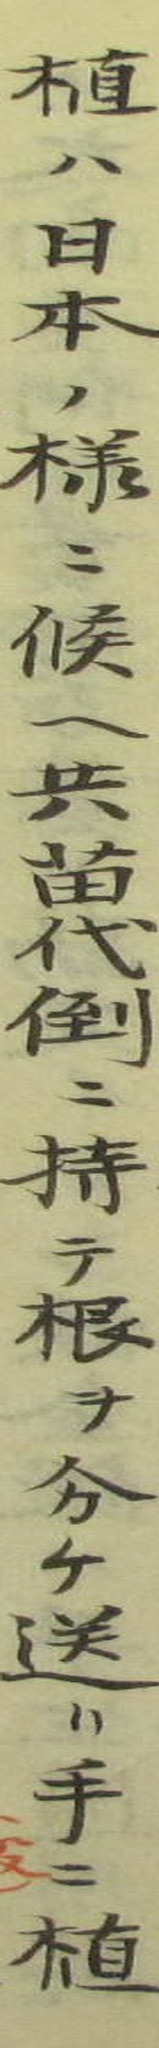植ハ日本ノ様ニ候ヘ共苗代倒ニ持テ根ヲ分ケ送リ手ニ植
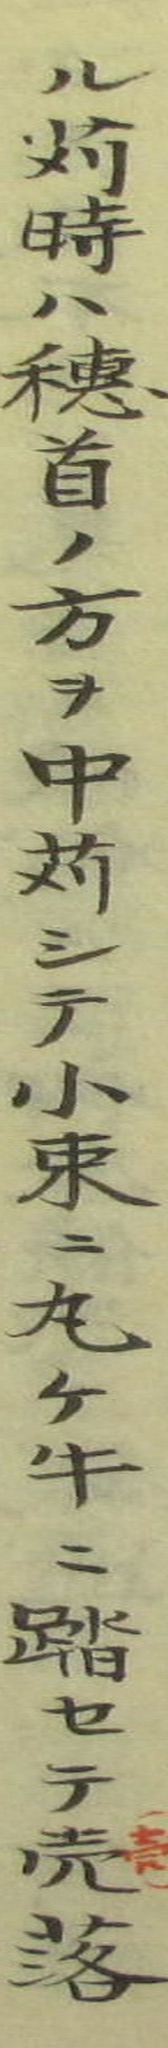ル苅時ハ穂首ノ方ヲ中苅シテ小束ニ丸ケ牛ニ踏セテ売落
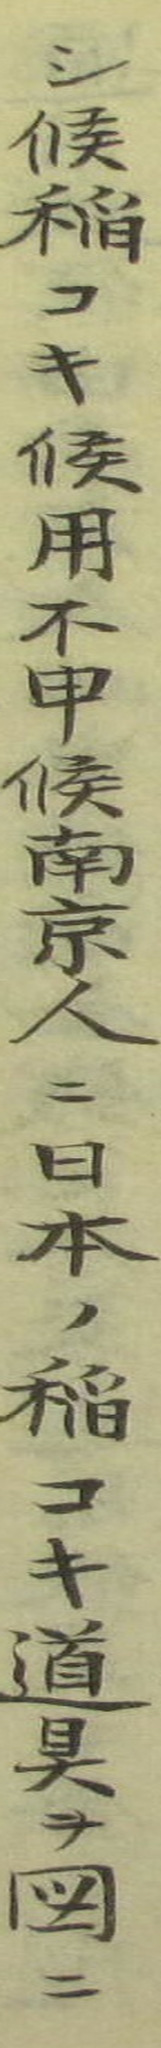シ候稲コキ候様不申候南京人ニ日本ノ稲コキ道具ヲ図ニ
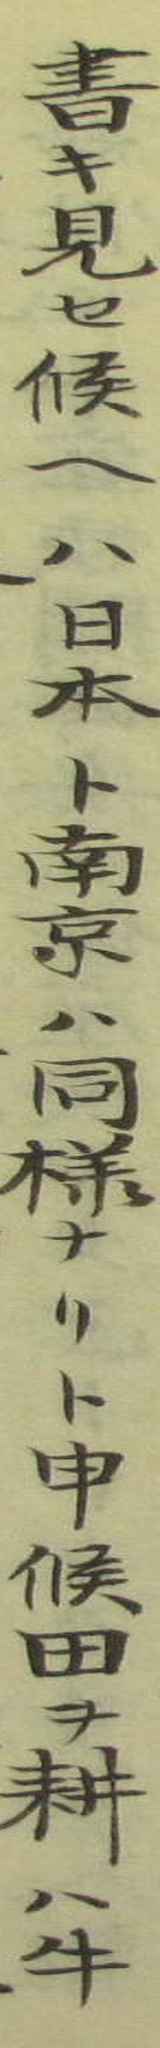書キ見セ候ヘハ日本ト南京ハ同様ナリト申候田ヲ耕ハ牛
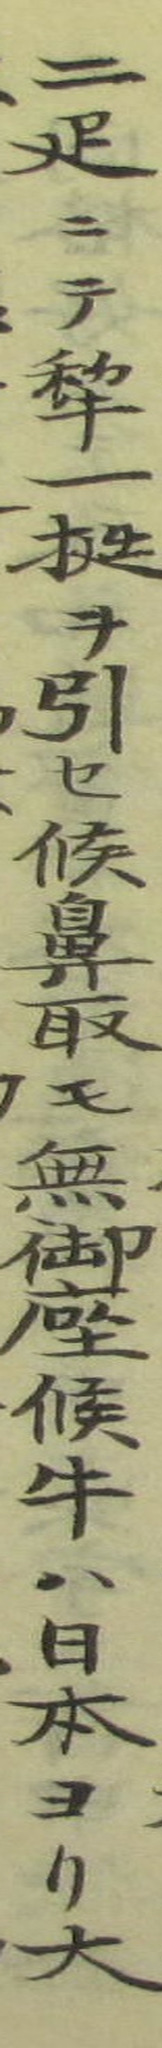二疋ニテ犂一挺ヲ引セ候鼻取モ無御座候牛ハ日本ヨリ大
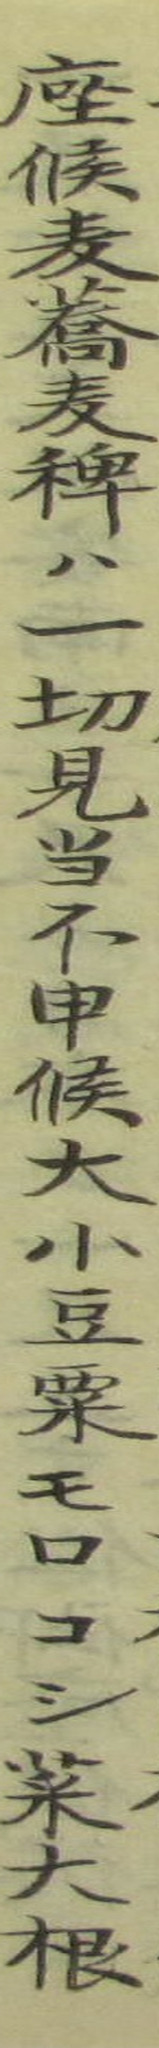座候麦蕎麦稗ハ一切見当不申候大小豆粟モロコシ菜大根
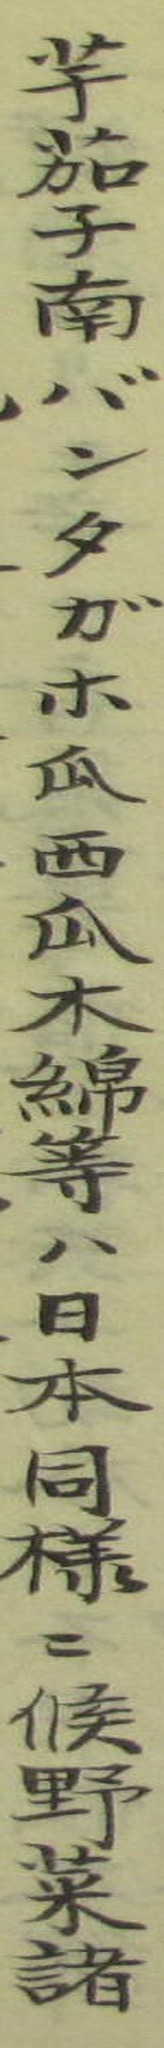芋茄子南バンタガホ瓜西瓜木綿等ハ日本同様ニ候野菜諸
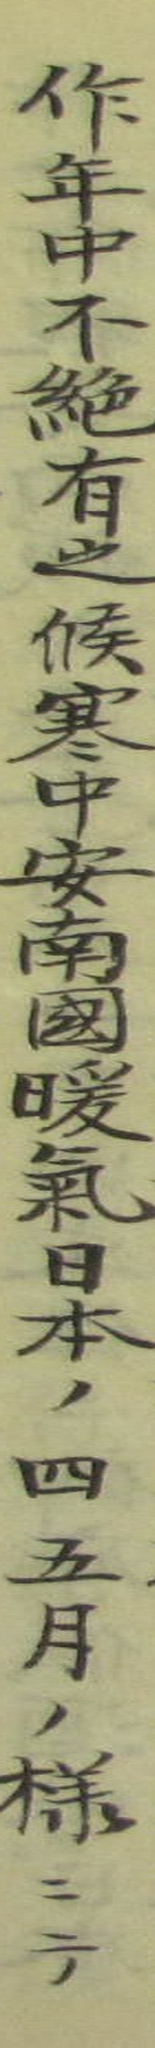作年中不絶有之候寒中安南國暖氣日本ノ四五月ノ様ニテ
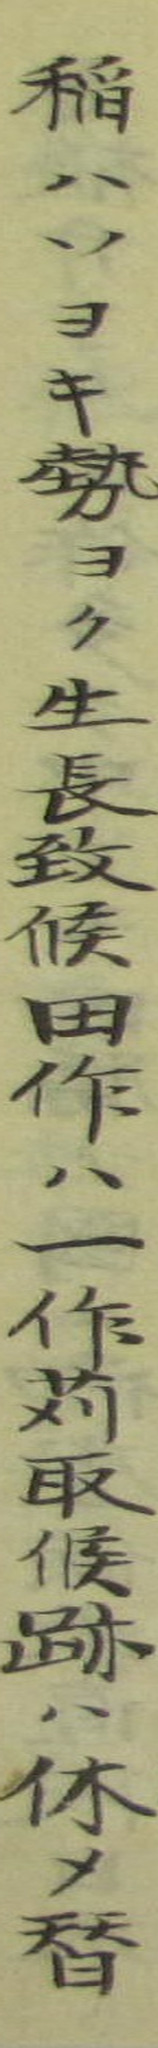稲ハソヨキ勢ヨク生長致候田作ハ一作苅取候跡ハ休メ替

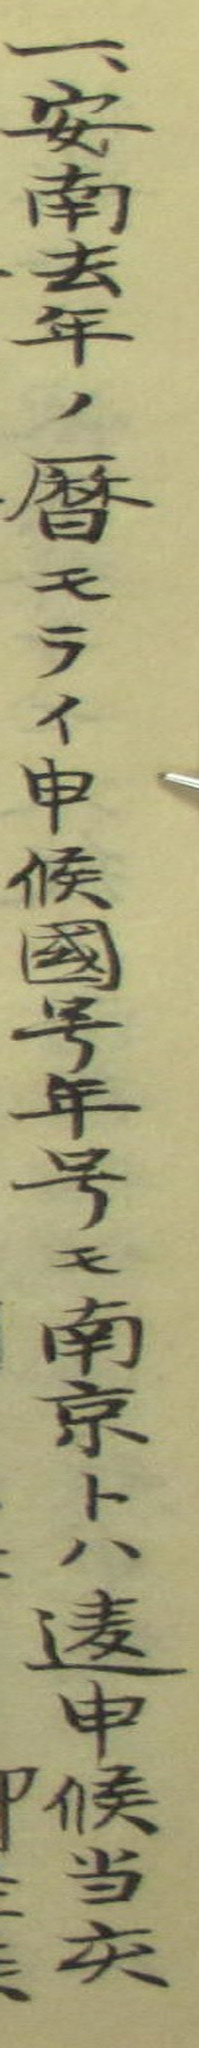一安南去年ノ暦モライ申候國号年号モ南京トハ違申候当亥
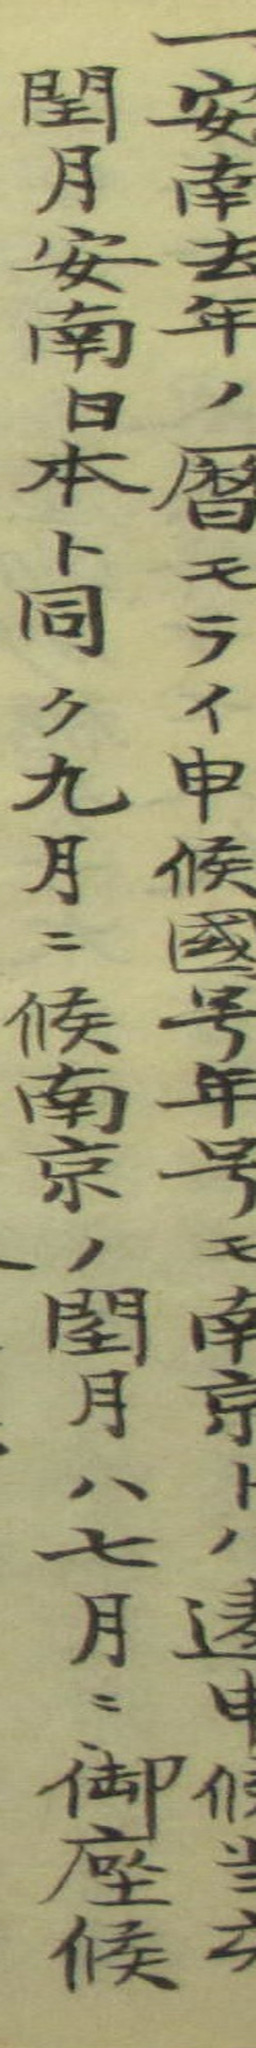閏月安南日本ト同ク九月ニ候南京ノ閏月ハ七月二御座候
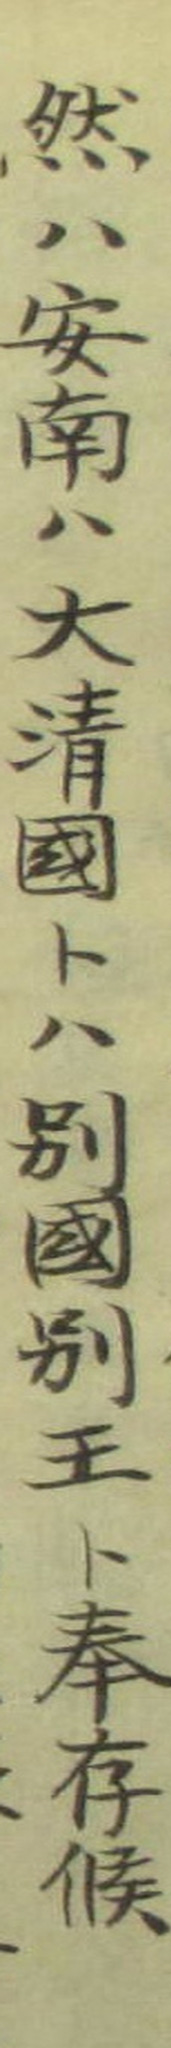然ハ安南ハ大清國トハ別國別王ト奉存候
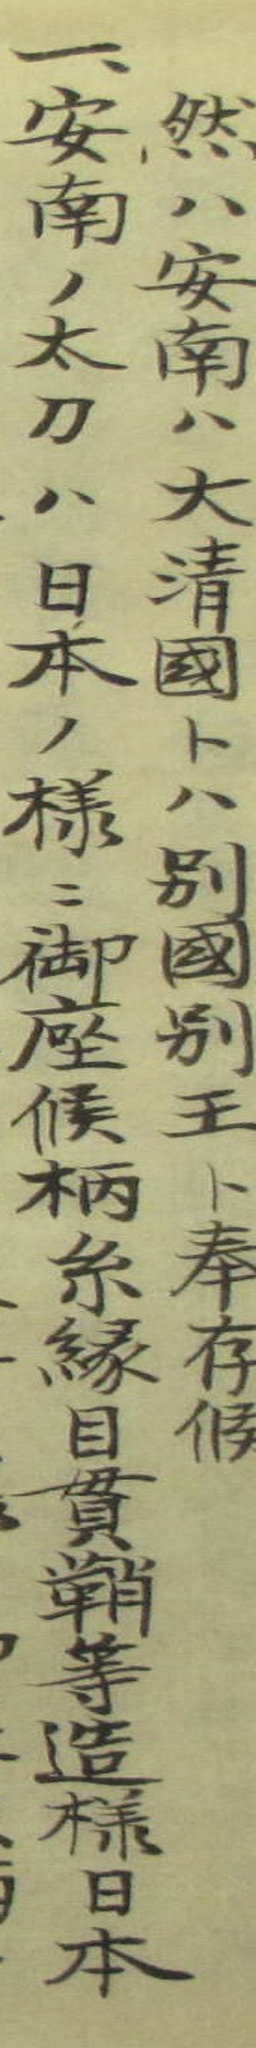一安南ノ太刀ハ日本ノ様ニ御座候柄糸縁目貫鞘等造様日本
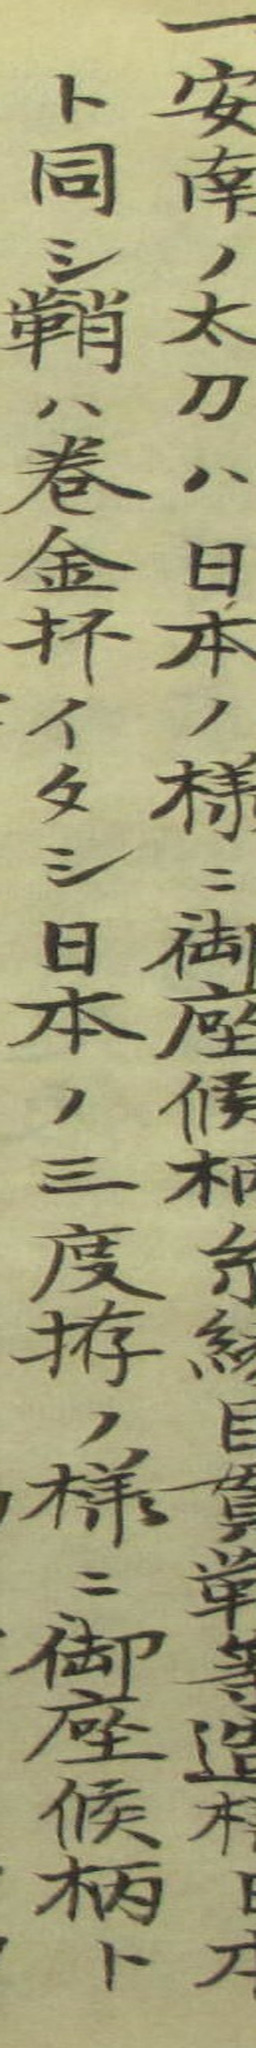ト同シ鞘ハ巻金抔イタシ日本ノ三度拵ノ様ニ御座候柄ト
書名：異国船漂着記 外二
